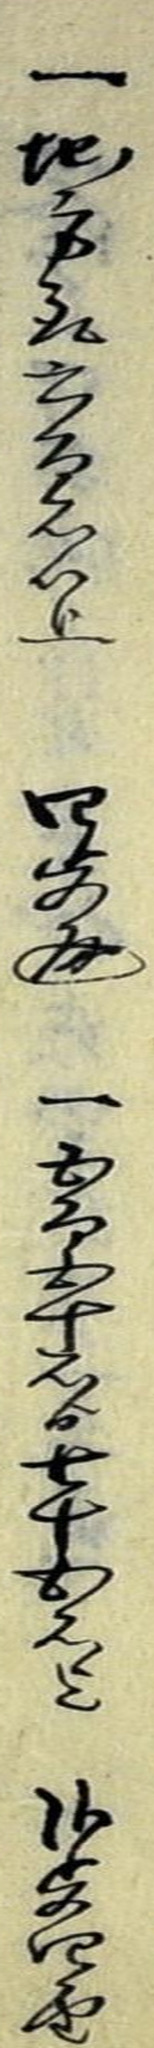一地方取六百石以上四歩通一五百五十石ゟ七十石迄弐歩四厘
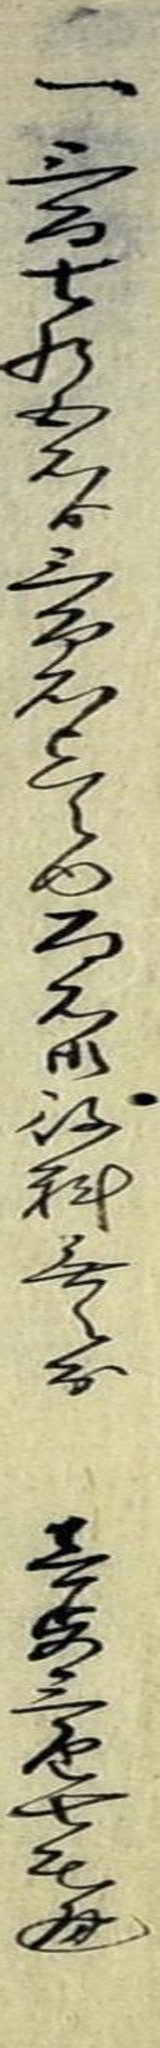一三百七拾五石ゟ三百石迄之内百石御役料無之分壱歩三厘七毛通
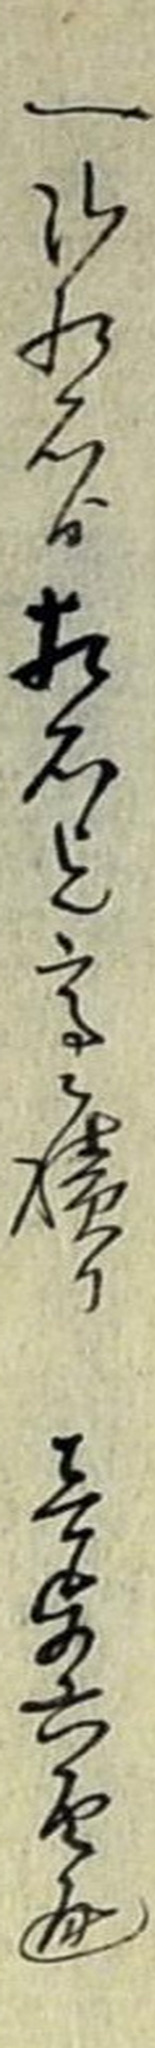一弐拾石ゟ拾石迄高に積り壱歩六厘通
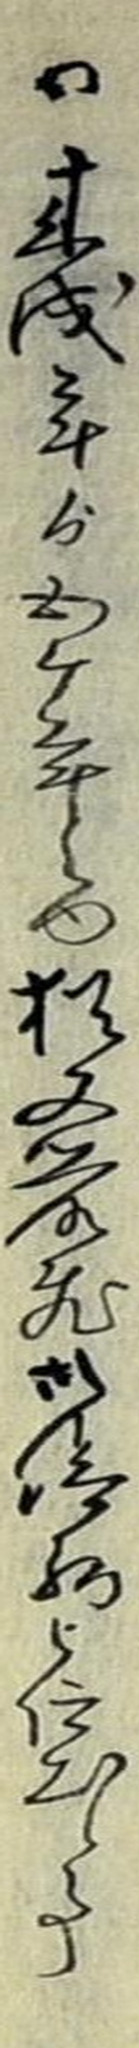〇来戌年ゟ五ヶ年之内猶又厳敷御倹約被仰出候事
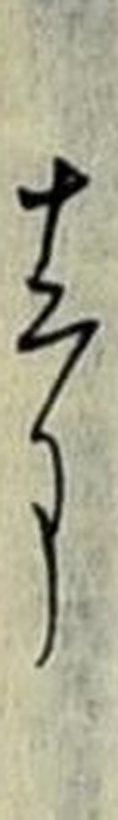十二月
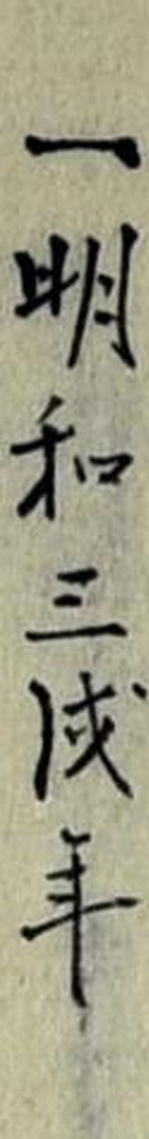一明和三戌年
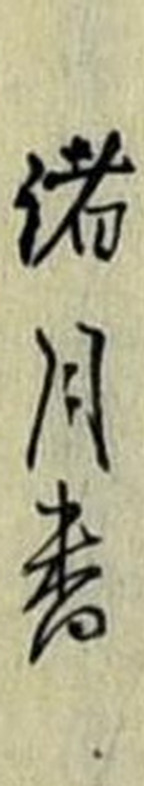諸月番
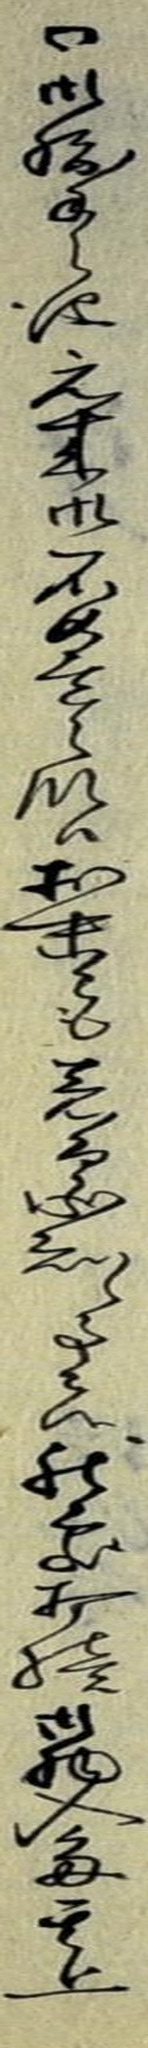〇御勝手之儀元来御不如意之段は於末々も兼而承知候事に候然処打続御物入多其上
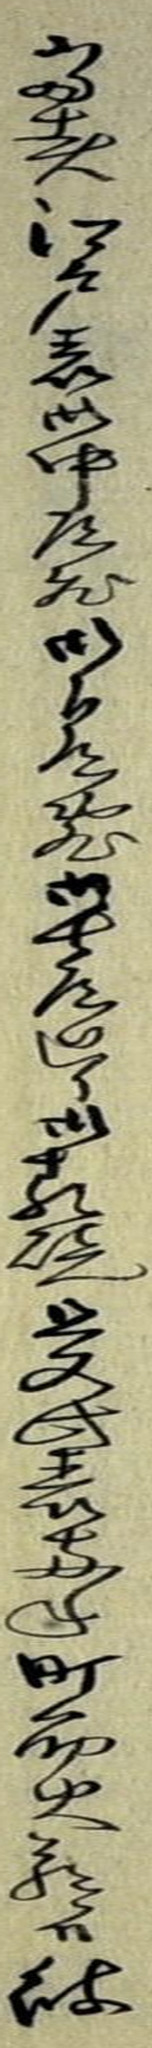当春江戸表御中屋敷御下屋敷御長屋廻り御類焼且又此表両年町筋火難に付彼
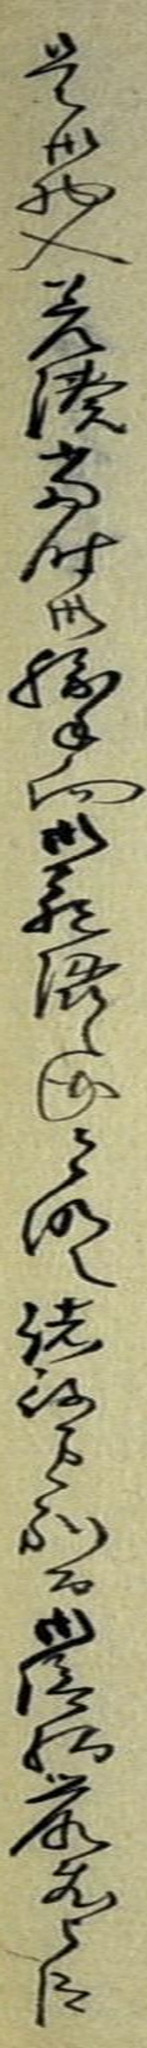是御物入差湊当時御勝手向御難渋之趣に候仍之諸役方へ別而御倹約厳敷被仰
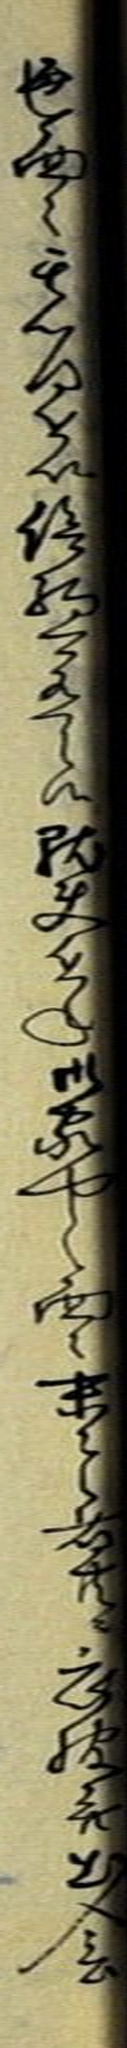通面々其心得を以倹約可有之候就夫近年御家中之面々末々之者共に衣服并出会
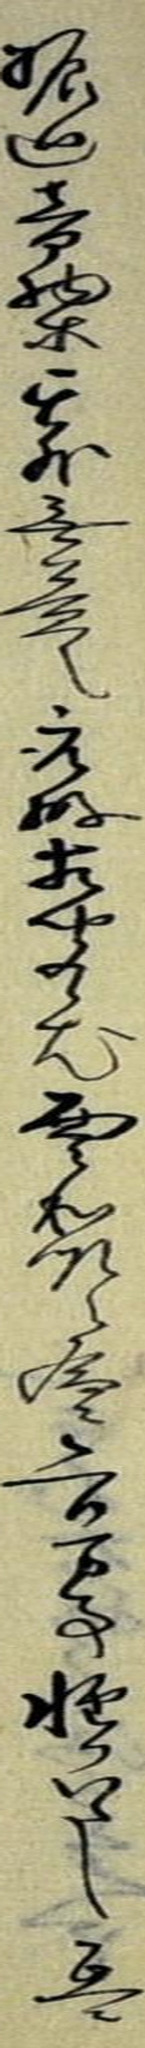振廻音物等其外無益之取扱相聞候尤面々和順之為に候へは万事軽くいたし互に
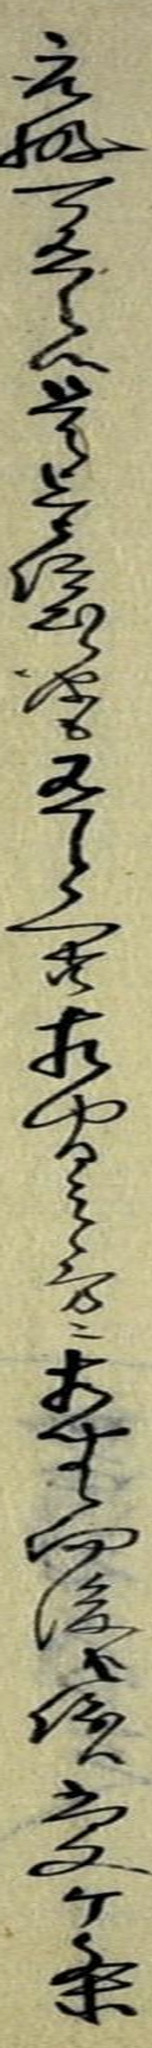取扱可有之候是迄被仰出候儀も有之候へ共相ゆるみ候方に相聞候向後之儀は尚又ケ条
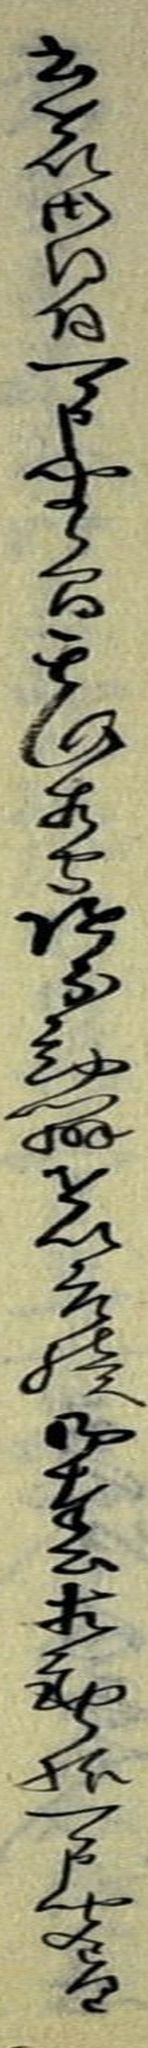書を以御目付可申聞候間其趣相守随分勘弁を以取続御奉公相勤候様可申聞旨被
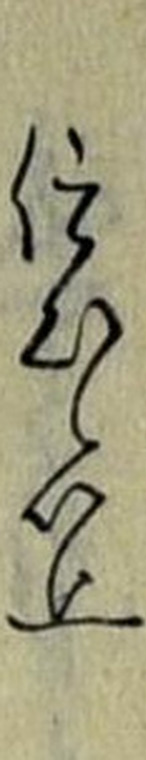仰出候以上
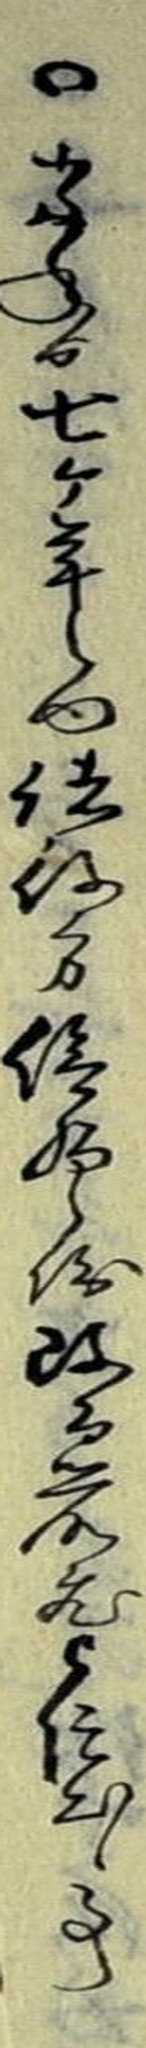〇当年ゟ七ヶ年之内諸役方倹約之儀改而厳敷被仰出候事
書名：命令之部 二
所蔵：福井県文書館 Fukui Prefectural Archives
